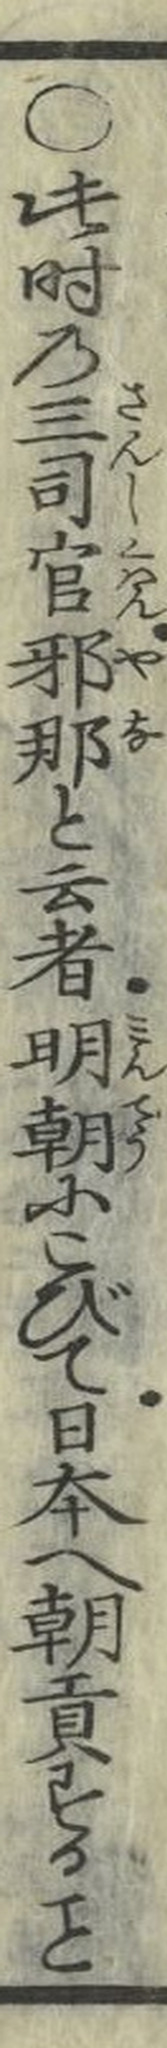○此時の三司官・邪那と云者・明朝にこびて・日本へ朝貢すること
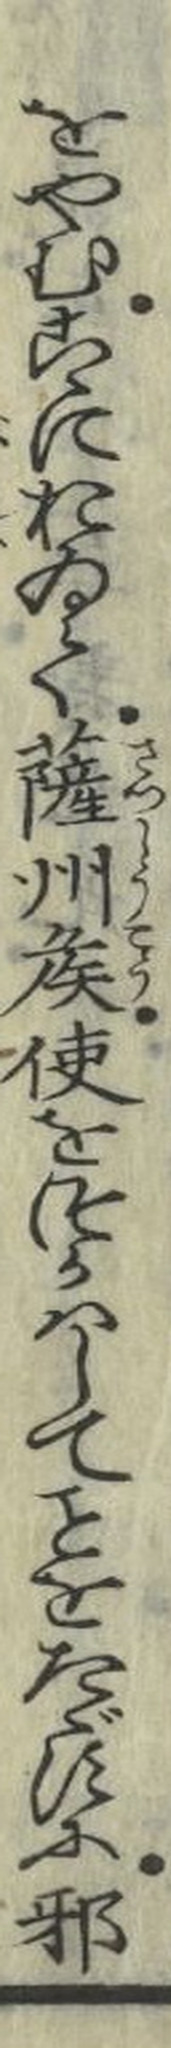をやむ・こゝにおゐて薩州候・使をつかはしてことをたゞすに・邪
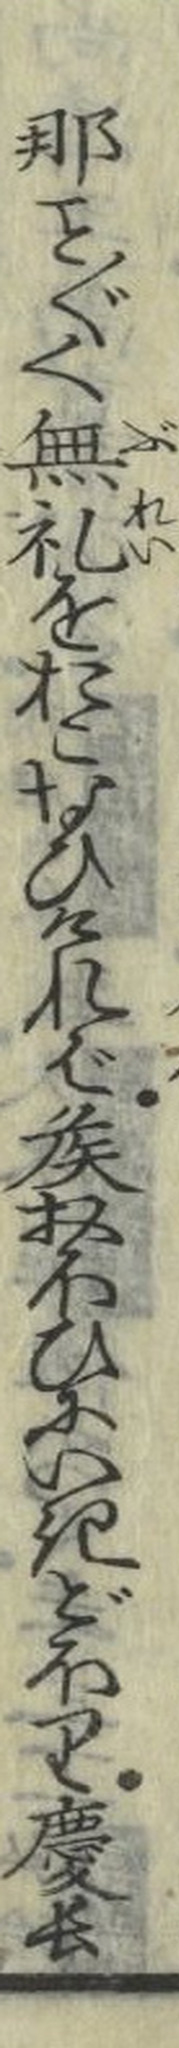那こと〴〵く無礼をおこなひければ・候おほいにいきどほり・慶長
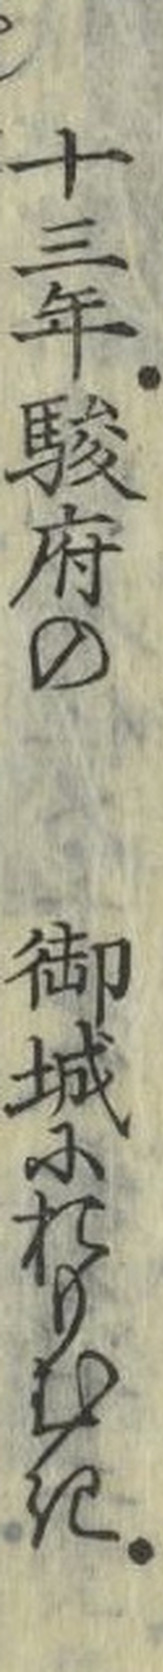十三年・駿府の御城におもむき・
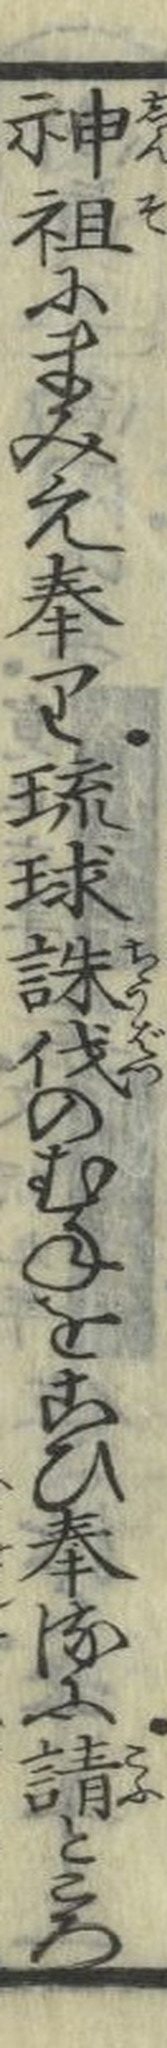神祖にまみえ奉り・琉球誅伐のむねをこひ奉るに・請ところ
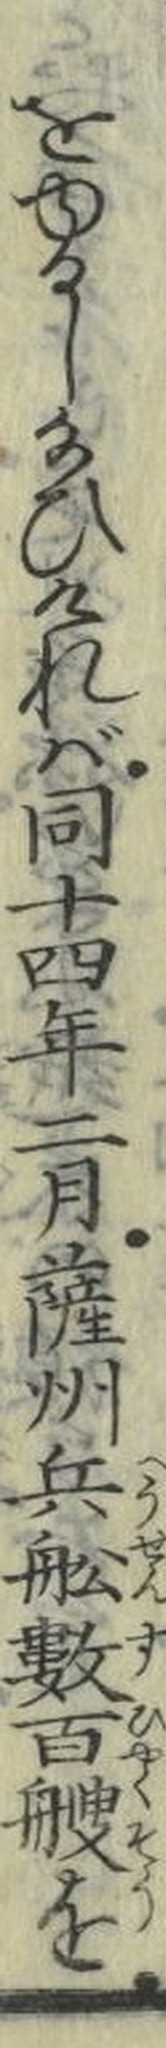をゆるし給ひければ・同十四年二月・薩州兵舩數百艘を・
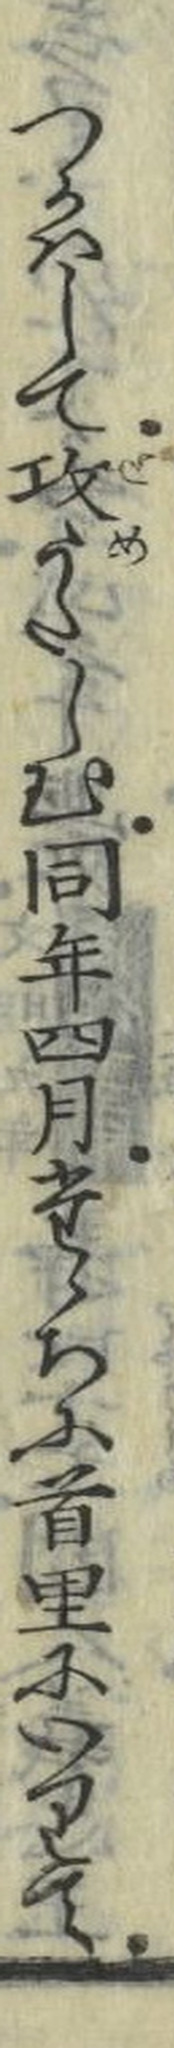つかはして・攻うたしむ・同年四月・たゝちに首里にいりて
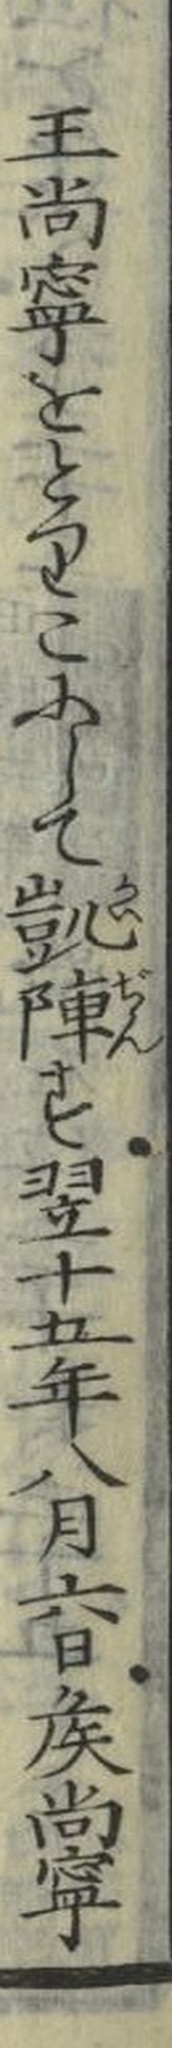王尚寧をとりこにして凱陣す・翌十五年八月六日・候尚寧
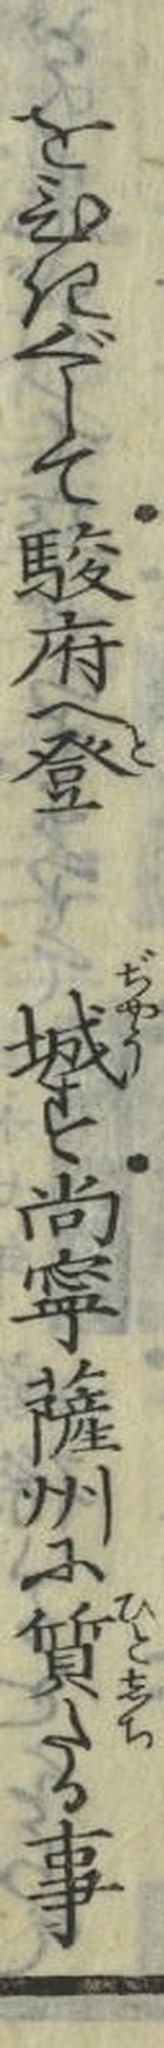をひきぐして駿府へ登城す・尚寧薩州に質たる事
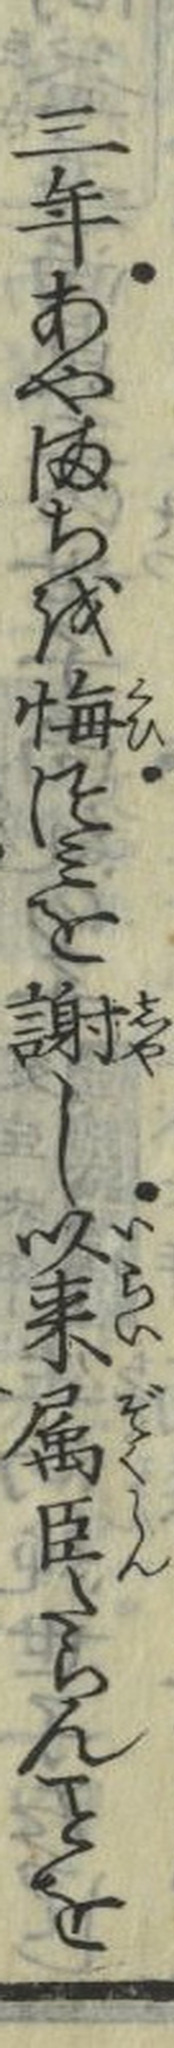三年・あやまちを悔・つみを謝し・以来属臣たらんことを
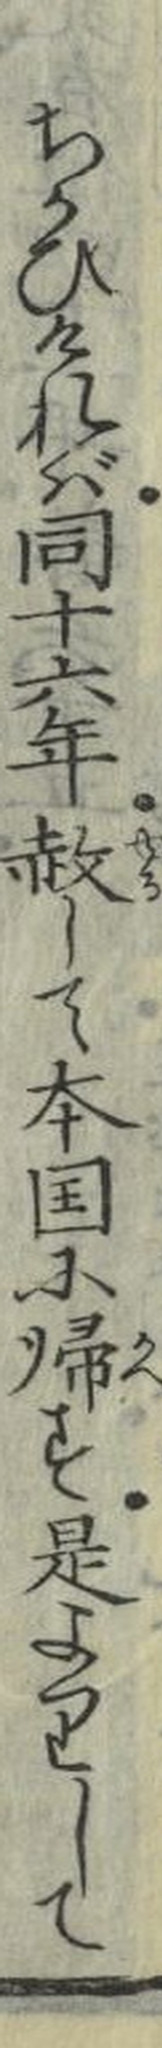ちかひければ・同十六年・赦して本国に帰す・是よりして
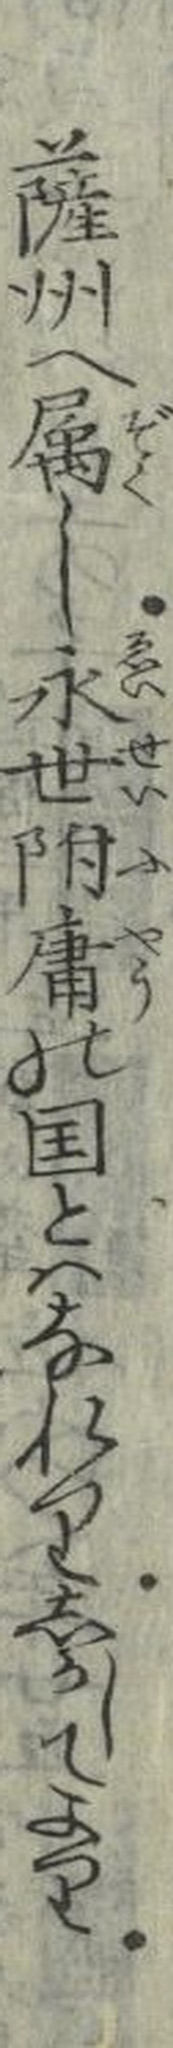薩州へ属し・永世附庸の国とはなれり・しかしてより・
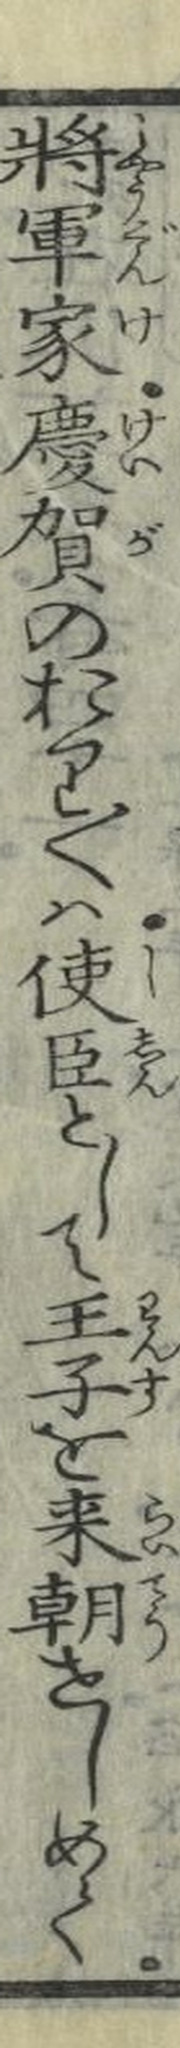將軍家・慶賀のおり〳〵は・使臣として王子を来朝せしめて・
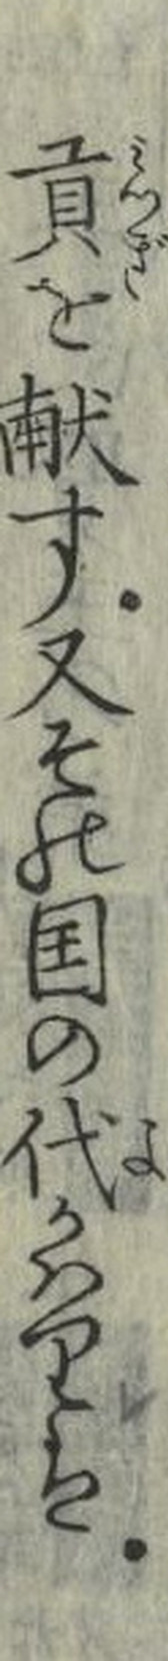貢を献す・又その国の代かはりす・
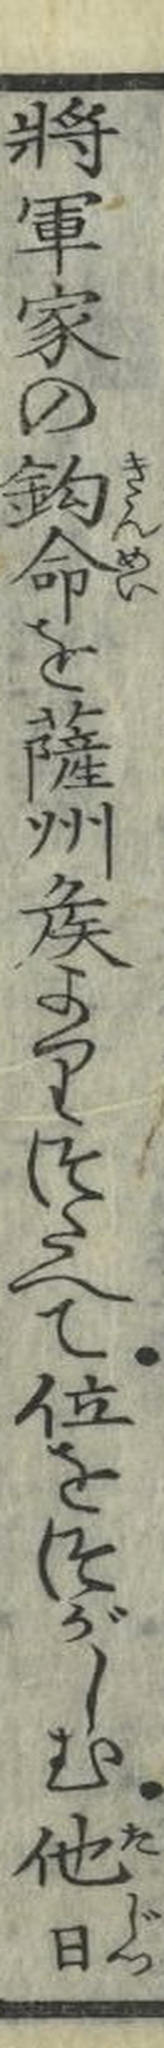將軍家の鈎命を薩州候よりつたへて・位をつがしむ・他日
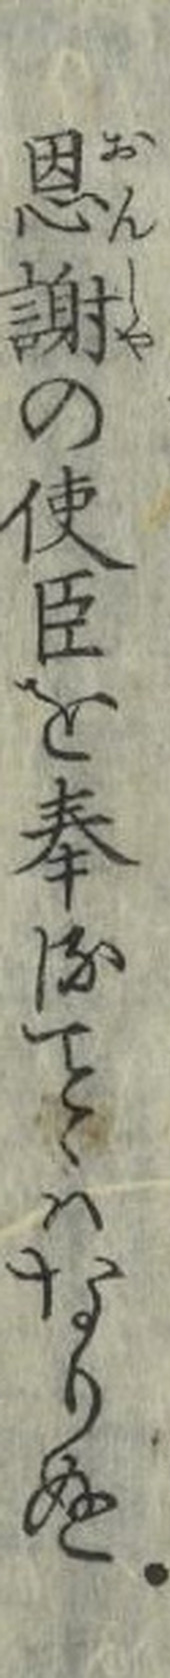恩謝の使臣を奉ることはなりぬ・
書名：琉球秊代記 附雑話 全
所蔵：University of the Ryukyus Library
